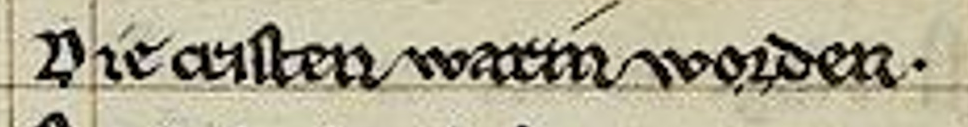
Die criſten warin worden.
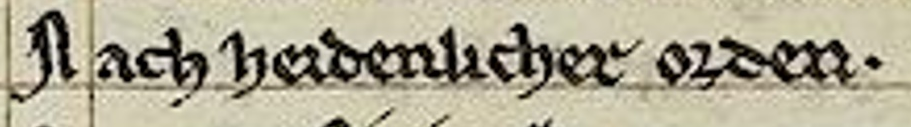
Nach heidenlicher orden.
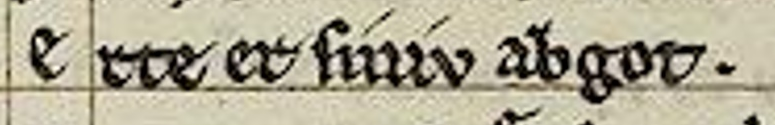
Erte er ſiniv abgot.
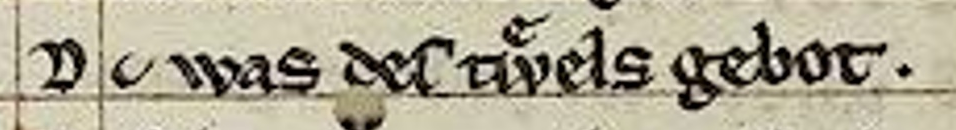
D(az) was deſ ti°evels gebot.
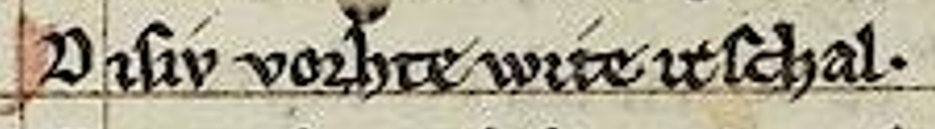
Diſiv vorhte wite irſchal.
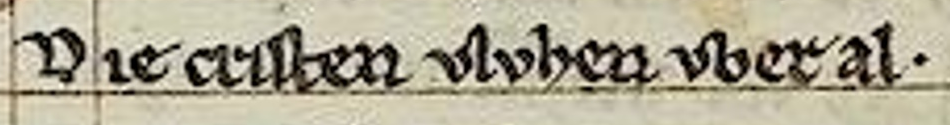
Die criſten vluhen vberal.
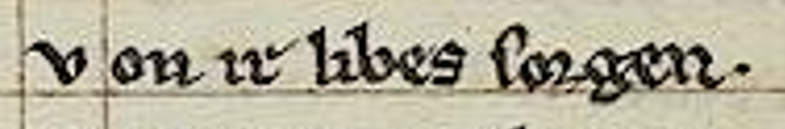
Von ir libes ſorgen.
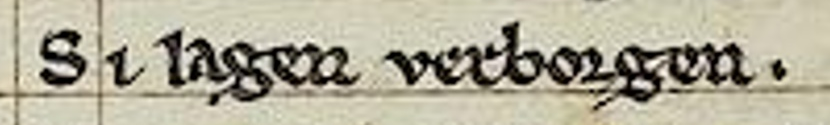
Si lagen verborgen.
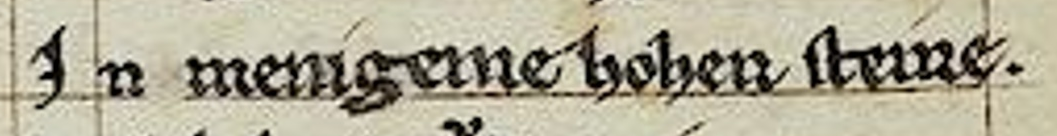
In menigeme hohen ſteine.
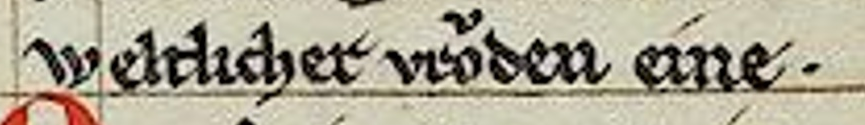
weltlicher vro°vden eine.
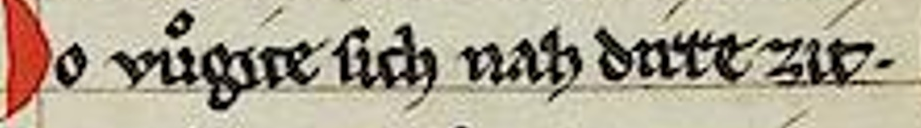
*Do vu°ogite ſich nah dirre zit.
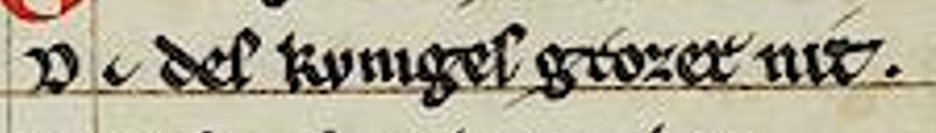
D(az) deſ kvnigeſ grozer nit.
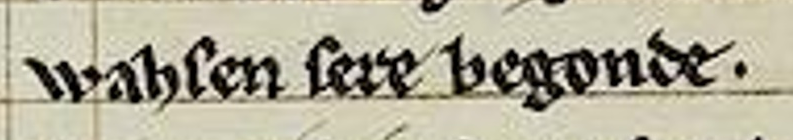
Wahſen ſere begonde.
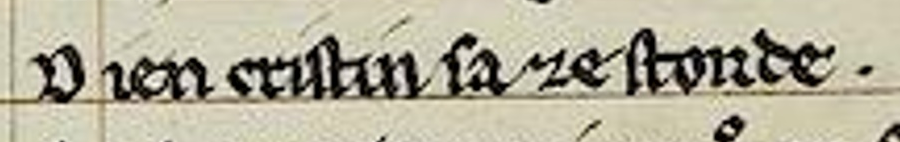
Dien criſtin ſa ze ſtonde.
